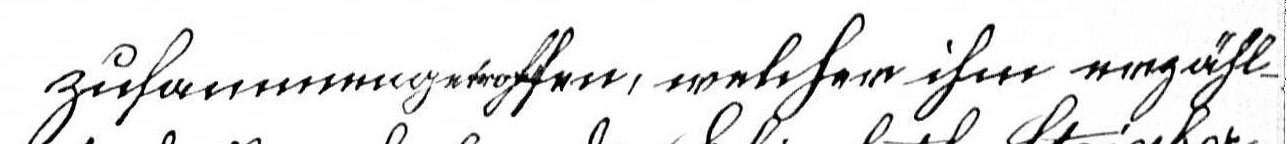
zusammengestroffen, welcher ihm erzähl¬
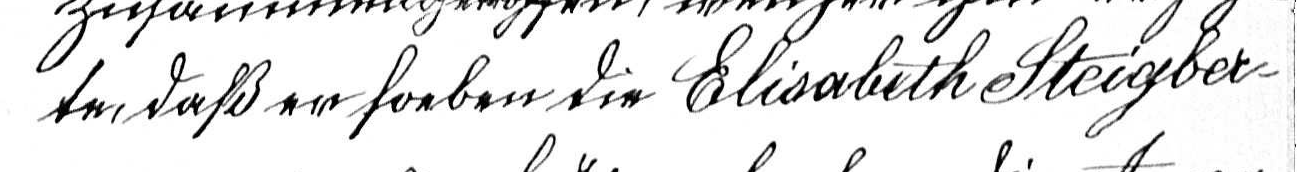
te, daß er soeben die Elisabeth Steigber¬
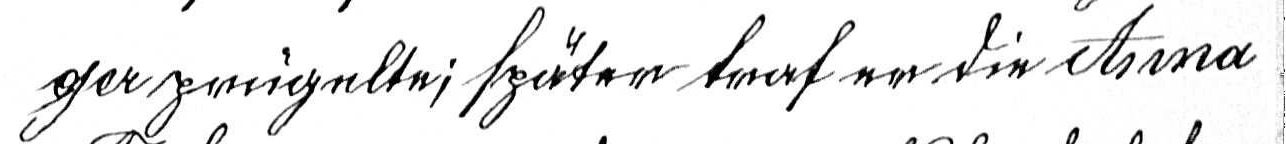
ger prügelte; später traf er die Anna
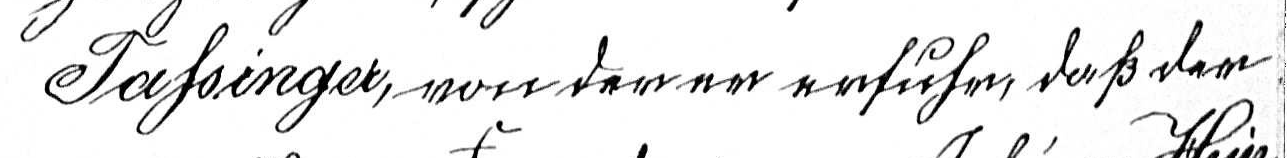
Tassinger, von der er erfuhr, daß der
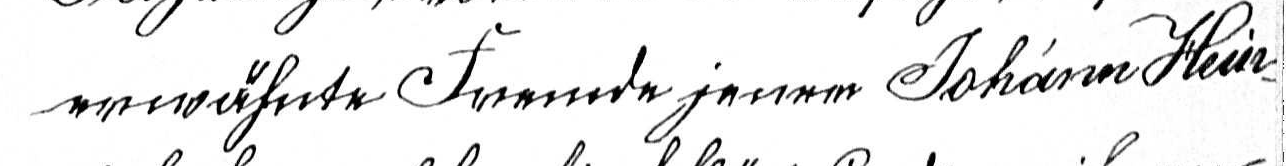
erwähnte Freunde jener Johánn Hein¬
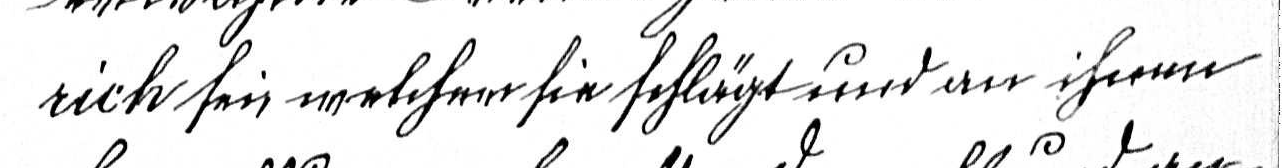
rich sei, welcher sie schlägt und an ihnen
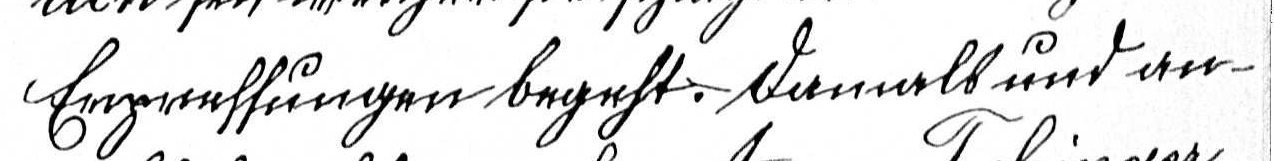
Erpressungen begeht. Damals und an¬
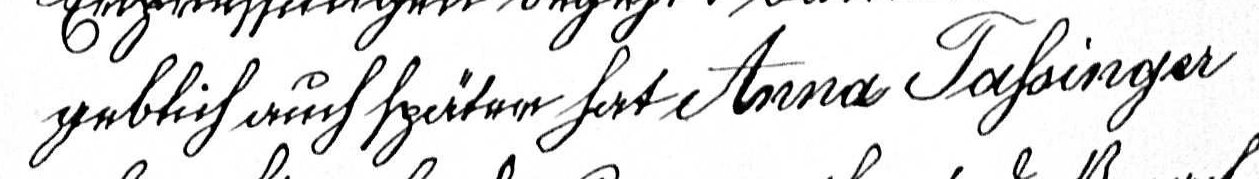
geblich auch später hat Anna Tassinger
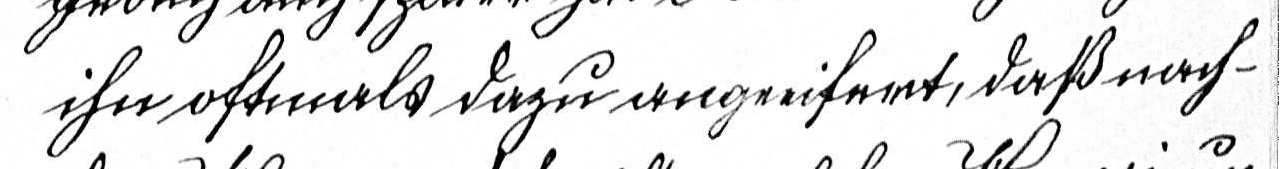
ihn oftmals dazu angeeifert, daß nach¬
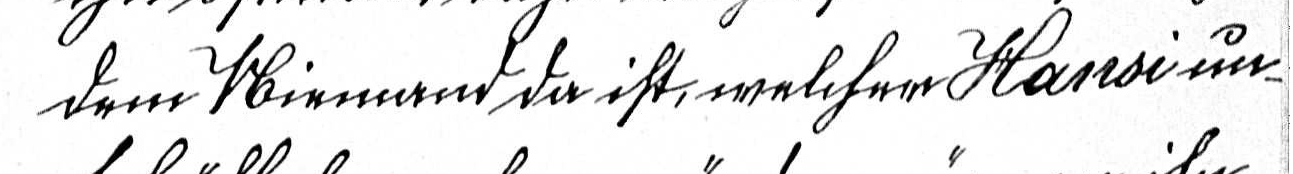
dem Niemand da ist, welcher Hansi un¬
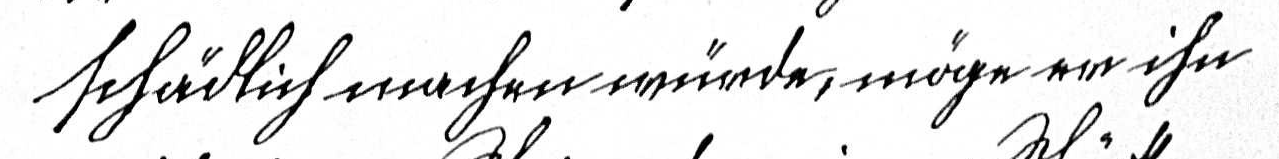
schädlich machen würde, möge er ihn
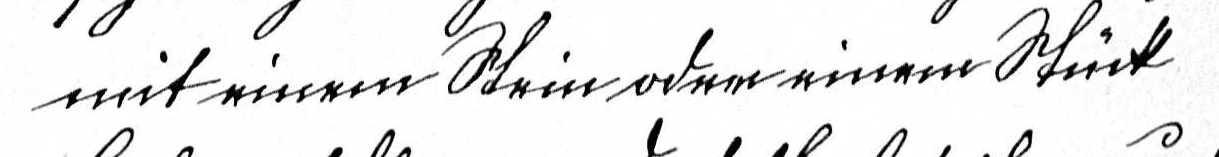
mit einem Stein oder einem Stück
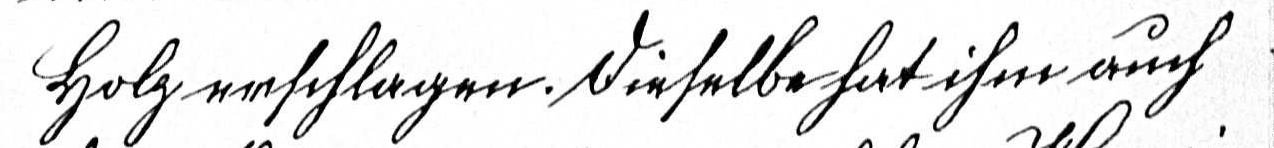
Holz erschlagen. Dieselbe hat ihm auch
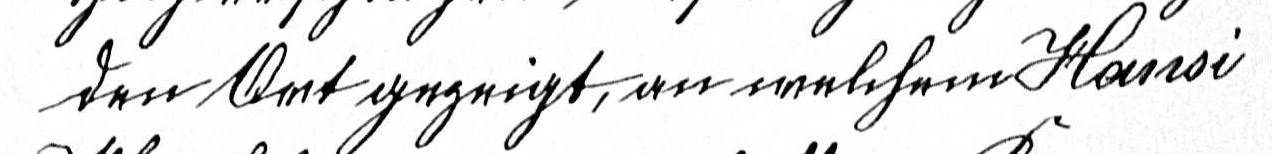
den Ort gezeigt, an welchem Hansi
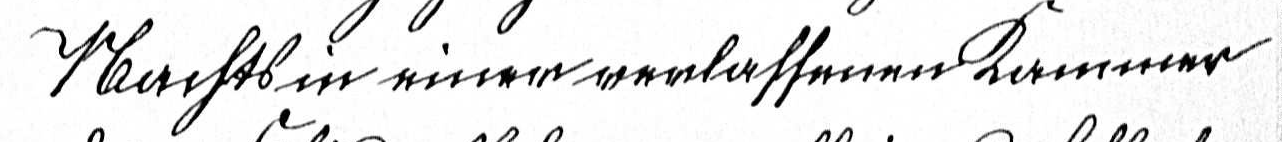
Nachts in einer verlassenen Kammer
